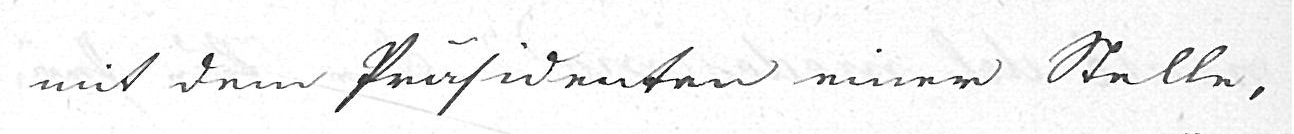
mit dem Präsidenten einer Stelle,
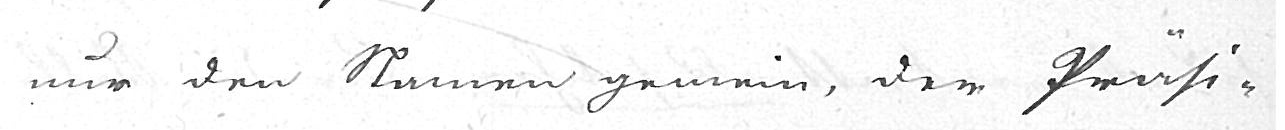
nur den Namen gemein; der Präsi-
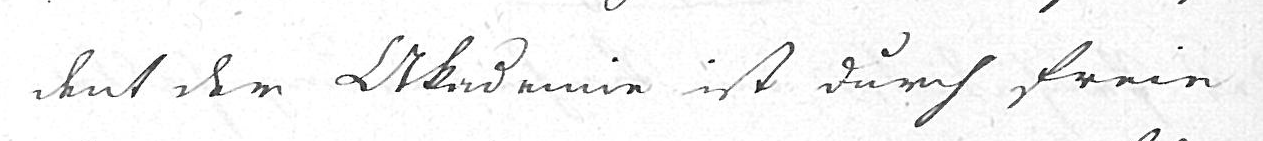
dent der Akademie ist durch freie
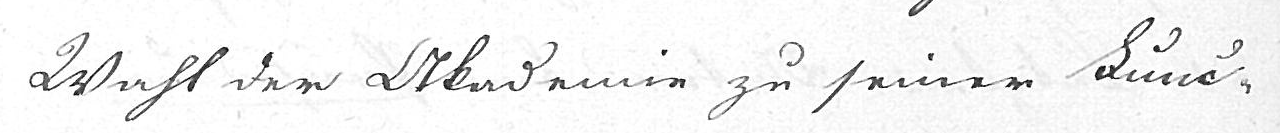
Wahl der Akademie zu seiner Func-
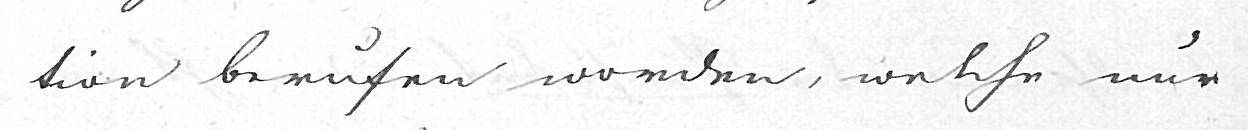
tion berufen worden, welche nur
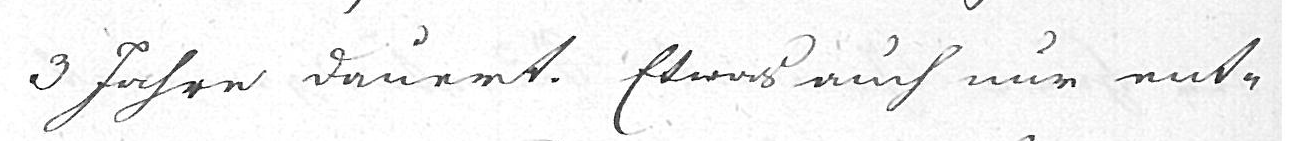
3 Jahre dauert. Etwas auch nur ent-
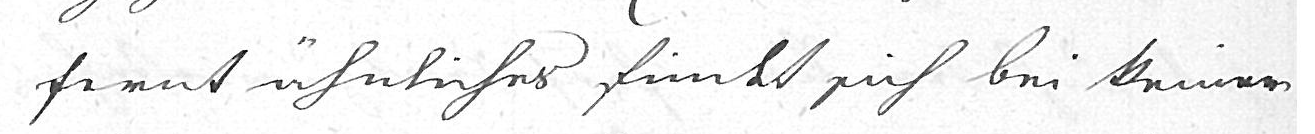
fernt ähnliches findet sich bei keiner
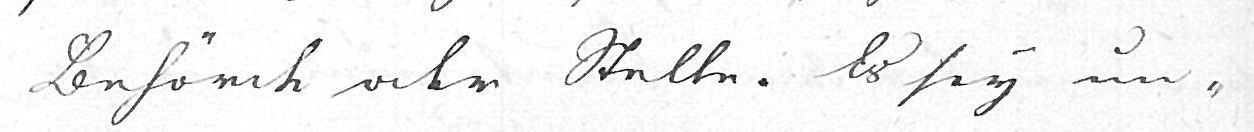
Behörde oder Stelle. Es sey un-
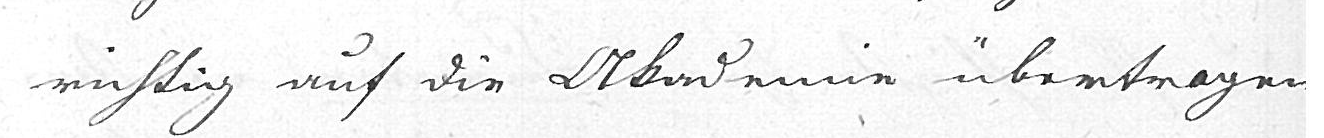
richtig auf die Akademie übertragen
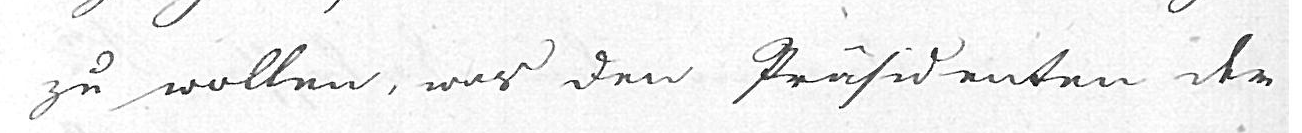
zu wollen, was den Präsidenten der
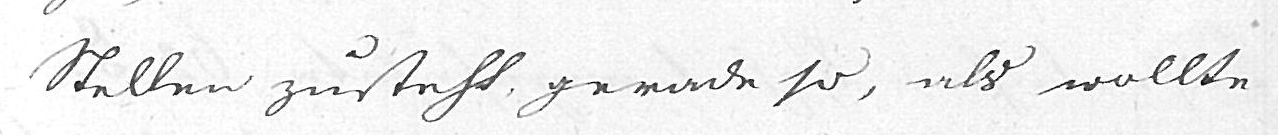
Stellen zusteht gerade so, als wollte
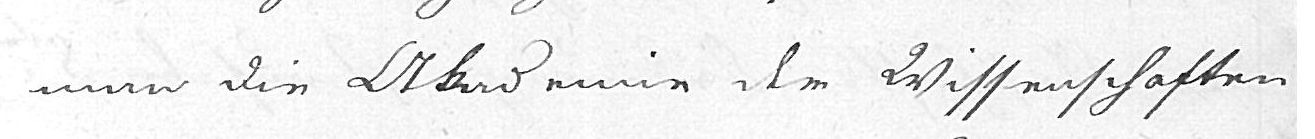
man die Akademie der Wissenschaften
